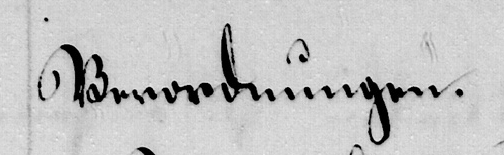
Verordnungen.
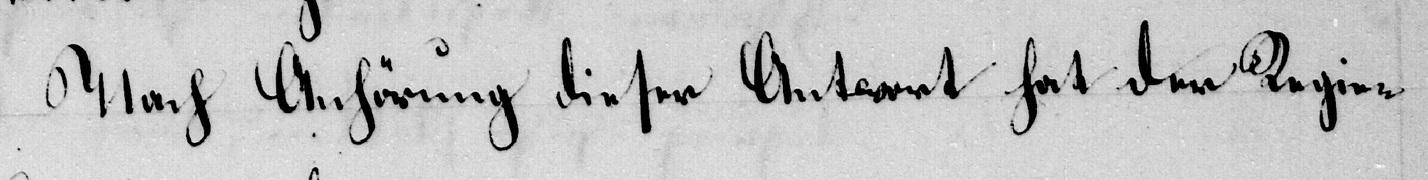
Nach Anhörung dieser Antwort hat der Regie¬
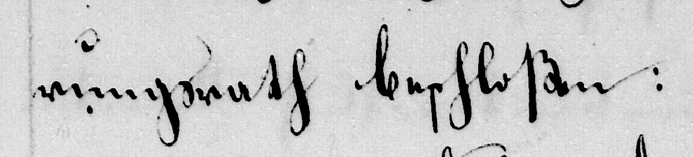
rungsrath beschloßen:
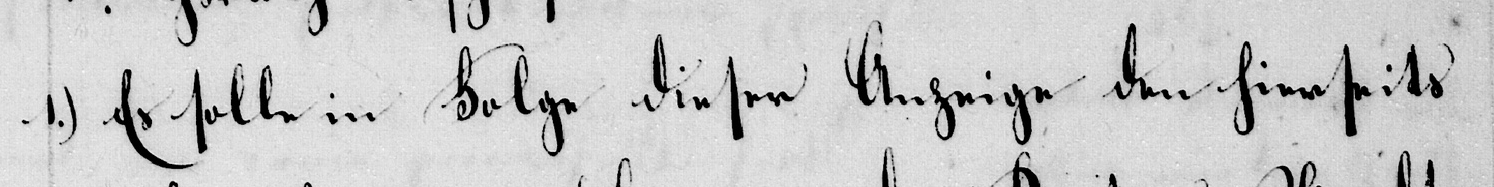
1.) Es solle in Folge dieser Anzeige den hierseits
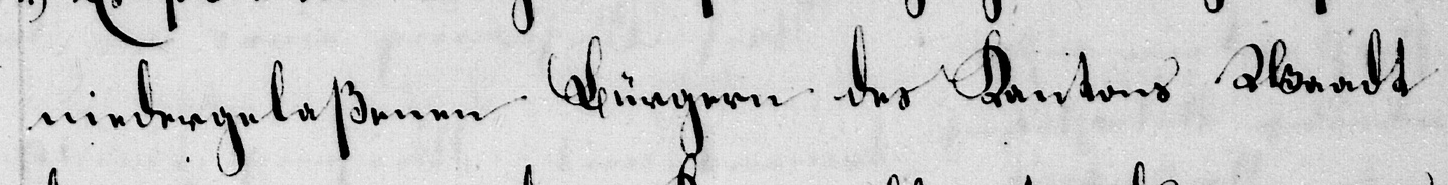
niedergelaßenen Bürgern des Kantons Waadt
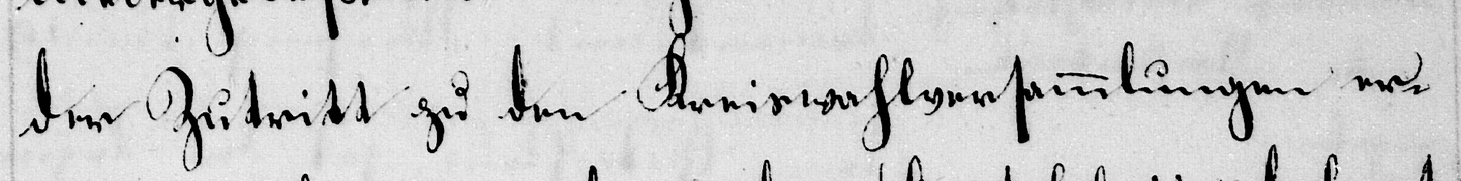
der Zutritt zu den Kreiswahlversammlungen er¬
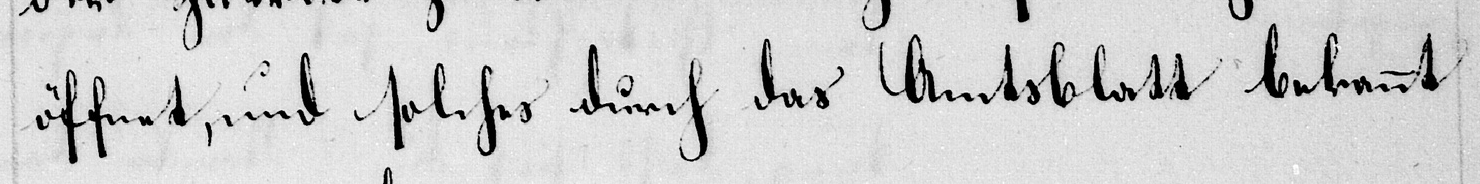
öffnet, und solches durch das Amtsblatt bekannt
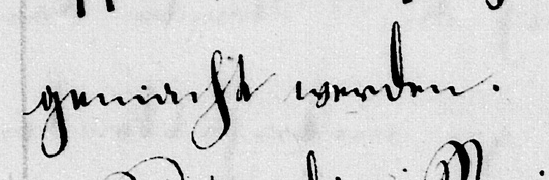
gemacht werden.
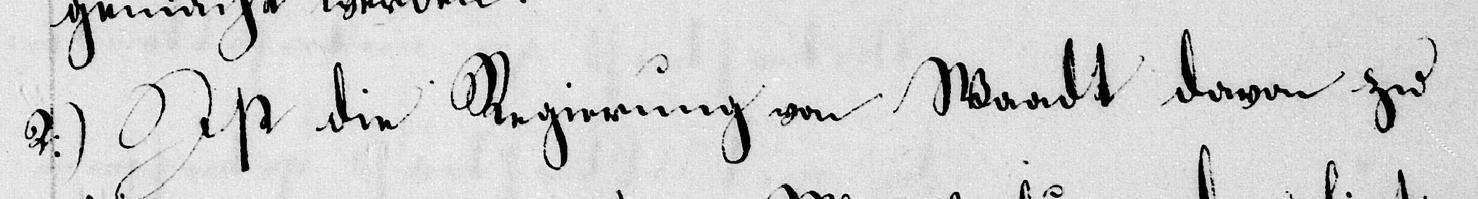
2.) Ist die Regierung von Waadt davon zu
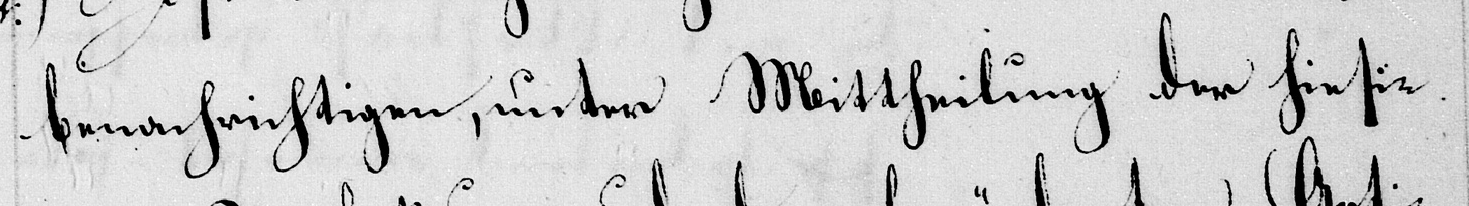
benachrichtigen, unter Mittheilung der hiesi¬
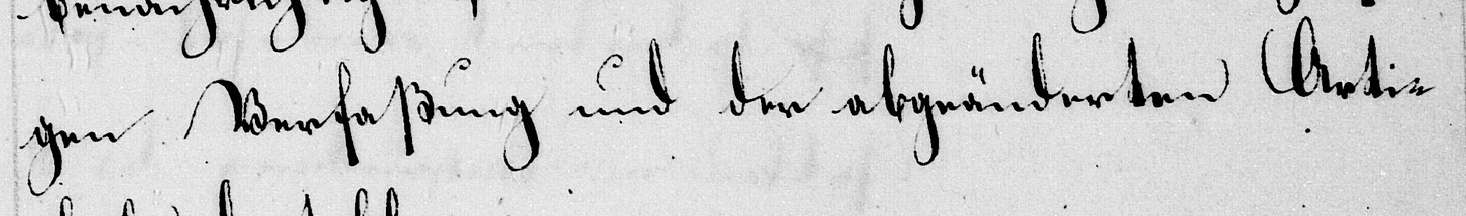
gen Verfaßung und der abgeänderten Arti¬
